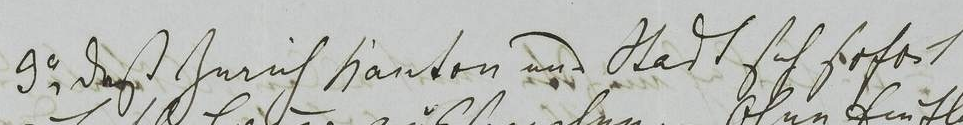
3o Daß ZürichKanton und Stadt sich sofort
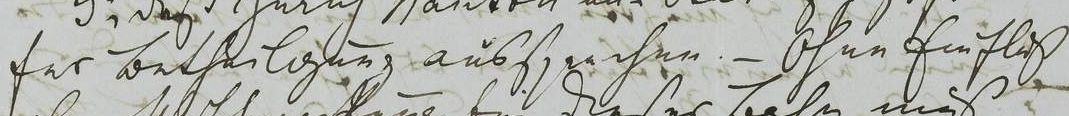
für Betheiligung aussprechen. – Ohne Einfluß
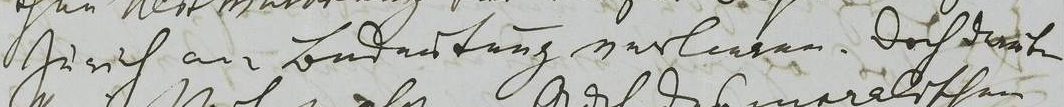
Zürich an Bedeutung verlieren. Doch darüber
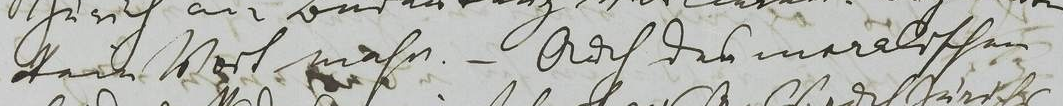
kein Wort mehr. – Auch des moralischen
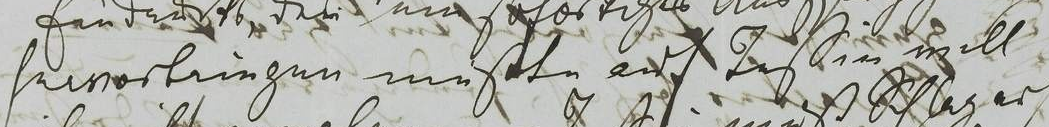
hervorbringen müßte auf Tessin will
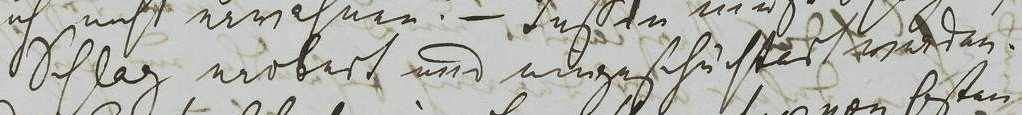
Schlag erobert und eingeschüchtert werden.
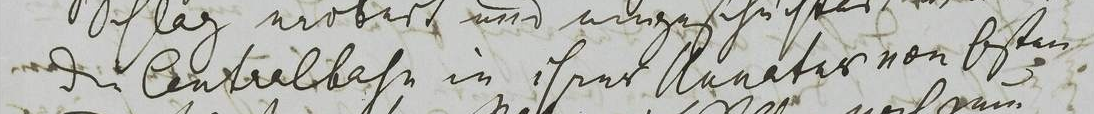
Die Centralbahn in ihrer Unnatur von Osten
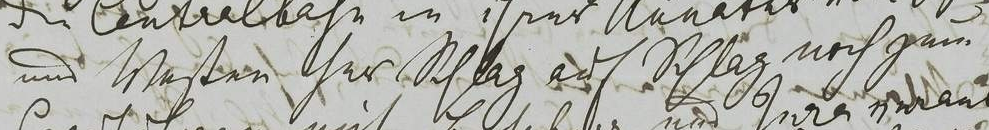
und Westen her Schlag auf Schlag noch zum
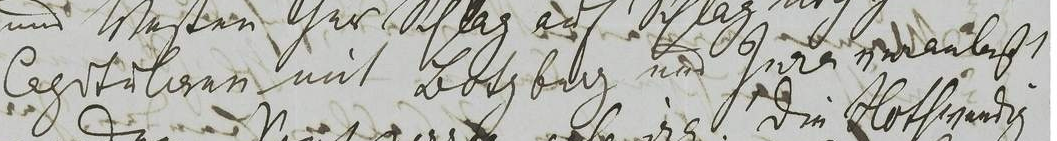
Capituliren mit Bötzberg und Jura veranlaßt
